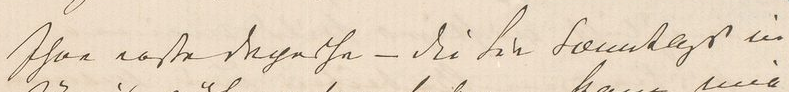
Ihre erste Depesche – die Sie Sonntags in
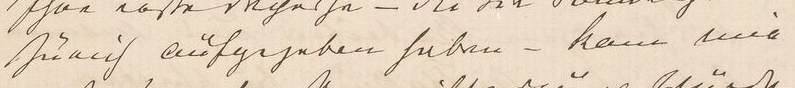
Zürich aufgegeben haben – kam mir
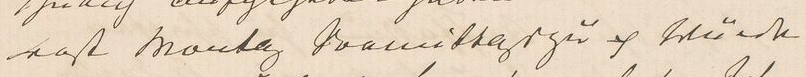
erst Montag Vormittags zu & wurde
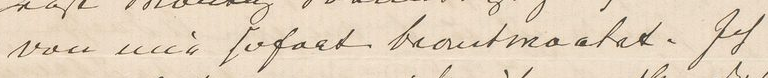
von mir sofort beantwortet. Ich
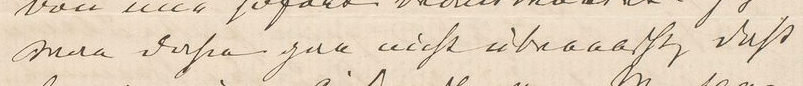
war daher gar nicht überrascht, daß
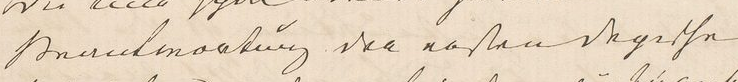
Beantwortung der ersten Depesche
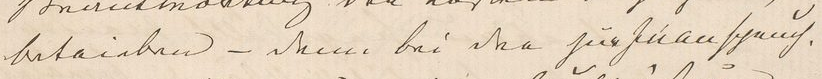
betrieben – denn bei der zur Inanspruch-
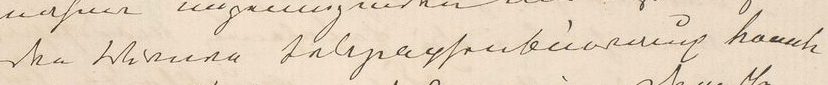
der Wiener Telegraphenbüreaux konnte
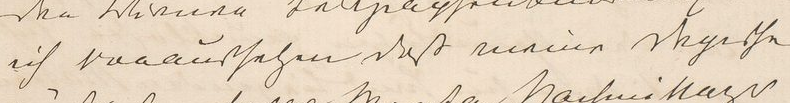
ich voraussehen daß meine Depesche
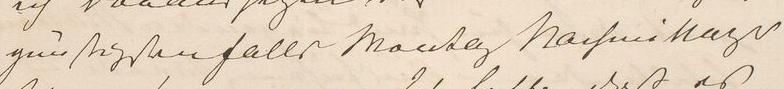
günstigstenfalls Montag Nachmittags
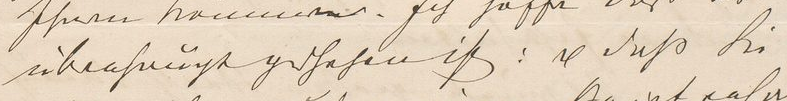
überhaupt geschehen ist: & daß Sie
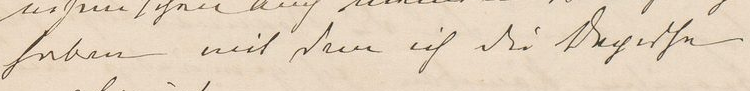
haben mit dem ich die Depesche
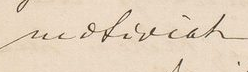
motivirte. –
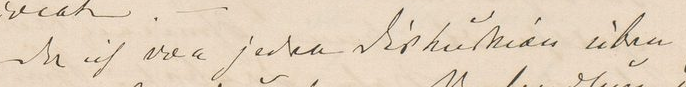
Da ich vor jeder Diskußion über
